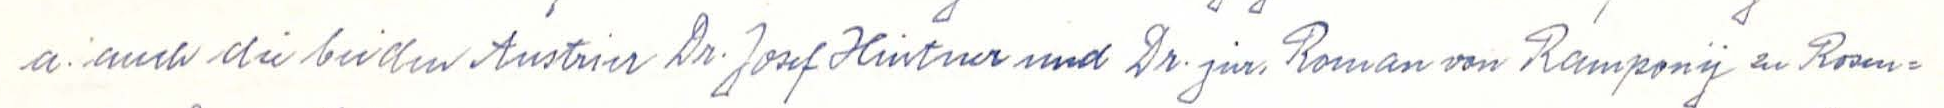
a. auch die beiden Austrier Dr. Josef Hintner und Dr. jur. Roman von Rompanis zu Rosen-
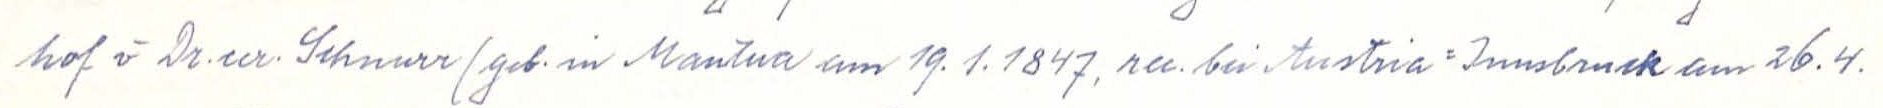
hof v/o Dr. cer. Schnurr (geb. in Mantua am 19.1.1847, rec. bei Austria-Innsbruck am 26.4.
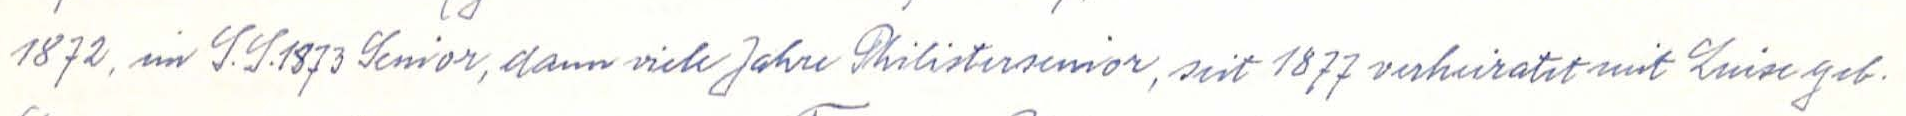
1872, im S.S.1873 Senior, dann viele Jahre Philistersenior, seit 1877 verheiratet mit Luise, geb.
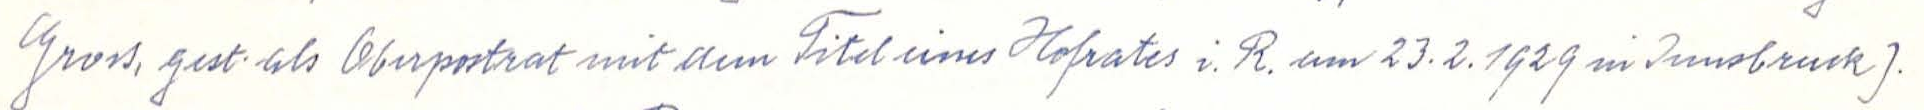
Gross, gest. als Oberpostrat mit dem Titel eines Hofrates i. R. am 23.2.1929 in Innsbruck).
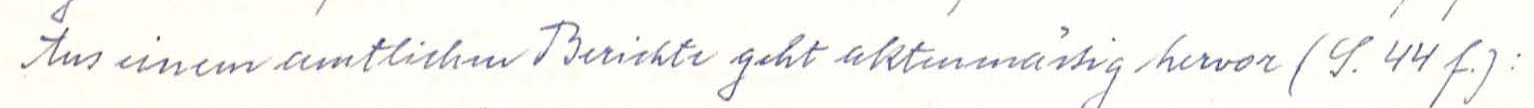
Aus einem amtlichen Berichte geht aktenmäßig hervor (S. 44 f.):
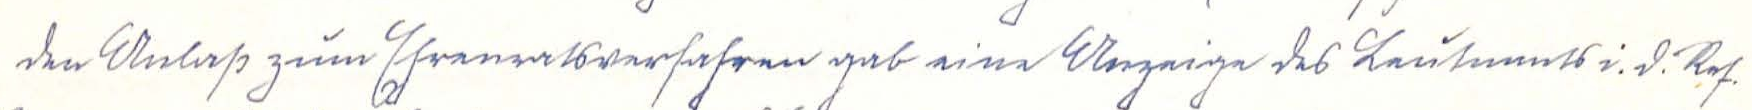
Der Anlaß zum Ehrenratsverfahren gab eine Anzeige des Leutnants i. d. Res.
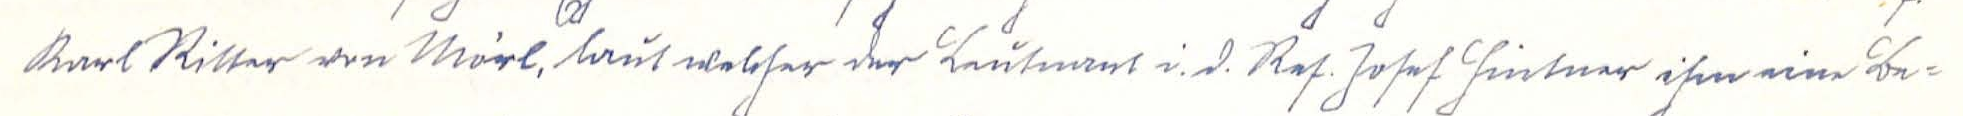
Karl Ritter von Mörl, laut welcher der Leutnant in der Res. Josef Hintner ihm eine Be-
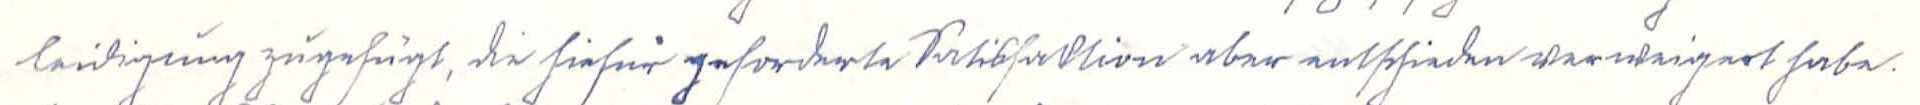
leidigung zugefügt, die hierfür geforderte Satisfaktion aber entschieden verweigert habe.
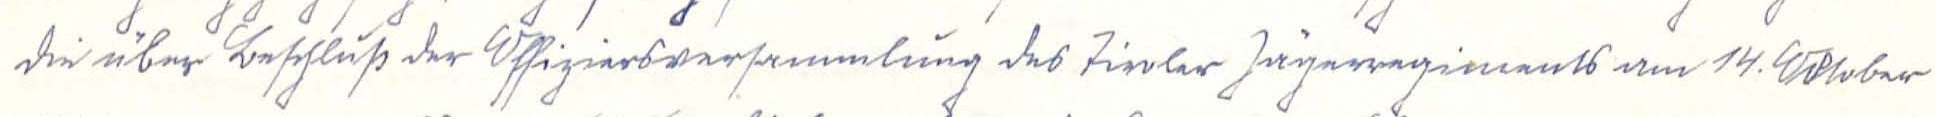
Die über Beschluss der Offiziersversammlung des Tiroler Jägerregiments am 14. Oktober
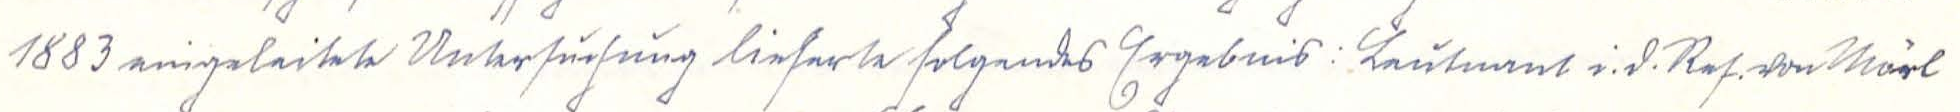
1883 eingeleitete Untersuchung lieferte folgendes Ergebnis: Leutnant i. d. Res. von Wörl
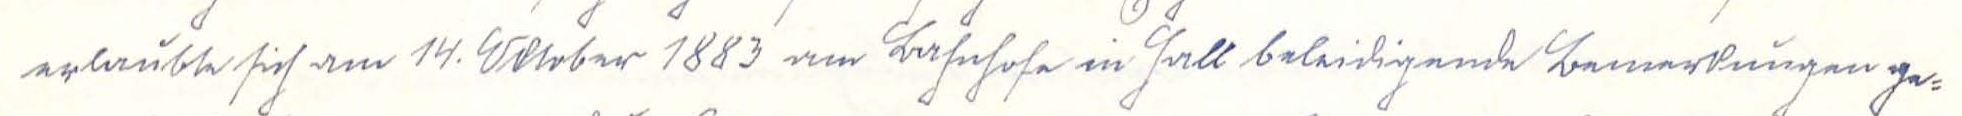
erlaubte sich am 14. Oktober 1883 am Bahnhofe in Hall beleidigende Bemerkungen ge-
